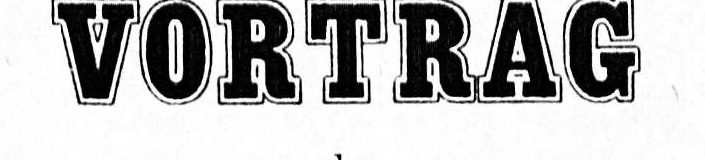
Vortrag
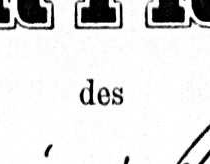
des
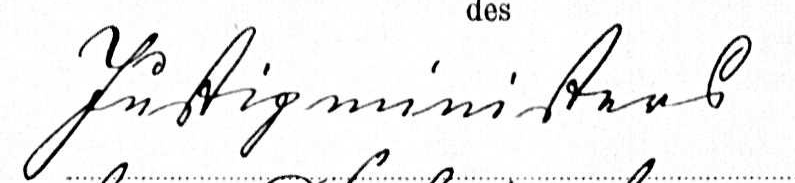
Justizministers
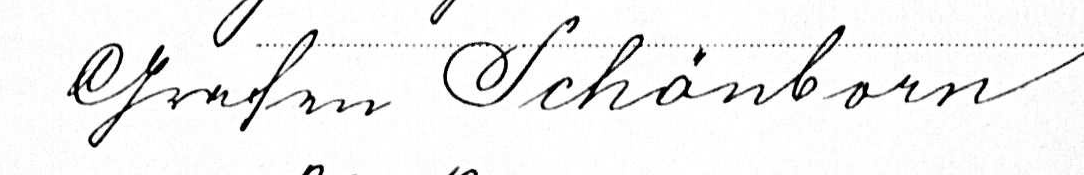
Grafen Schönborn
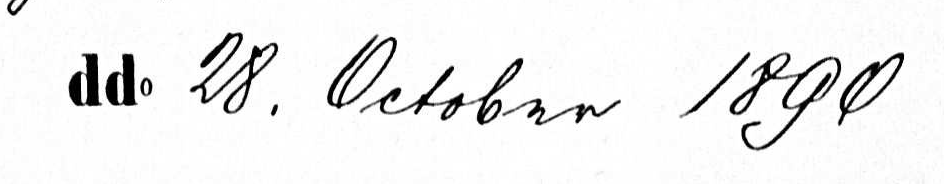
ddo 28. October 1890
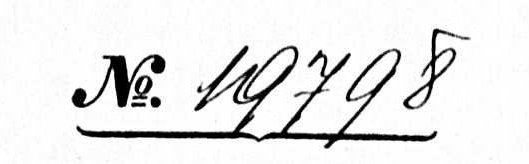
No. 19798
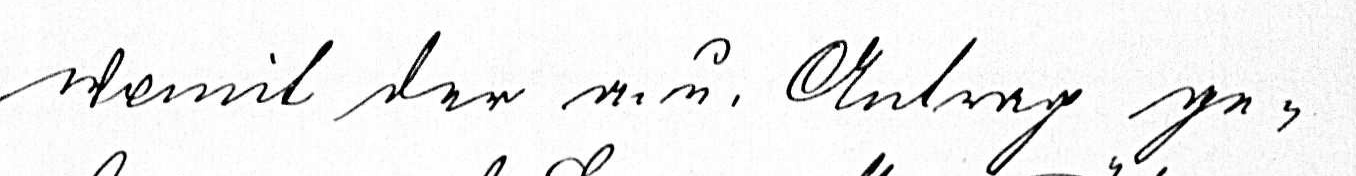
womit der a. u. Antrag ge¬
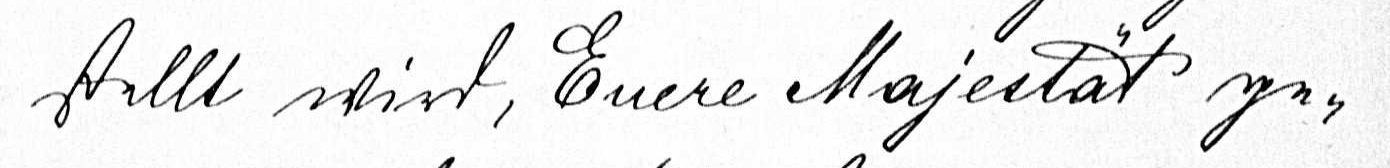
stellt wird, Euere Majestät ge¬
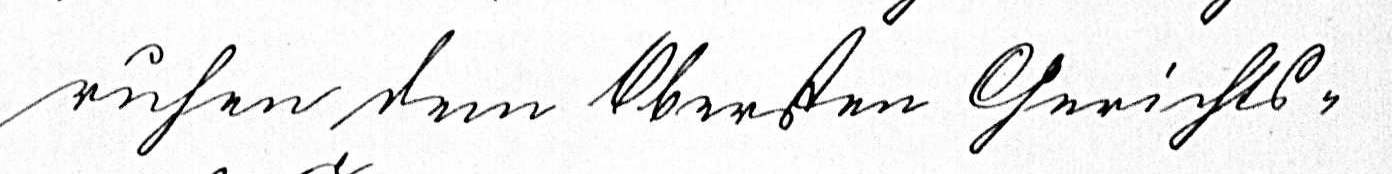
ruhen dem Obersten Gerichts-
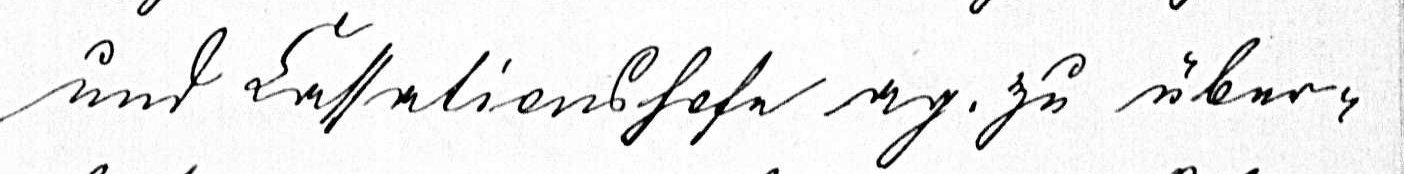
und Cassationshofe ag. zu über¬
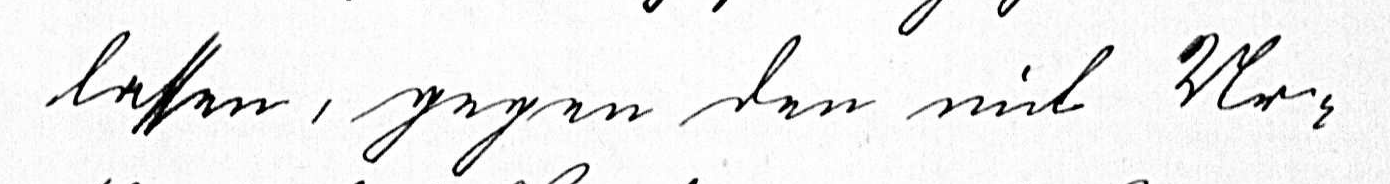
lassen, gegen den mit Ur¬
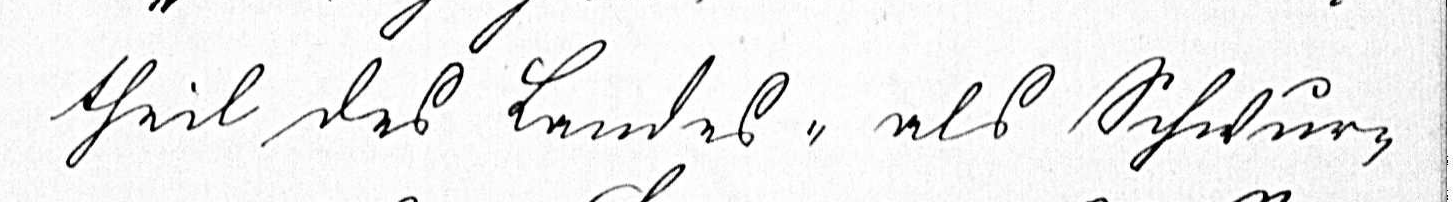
theil des Landes- als Schwur¬
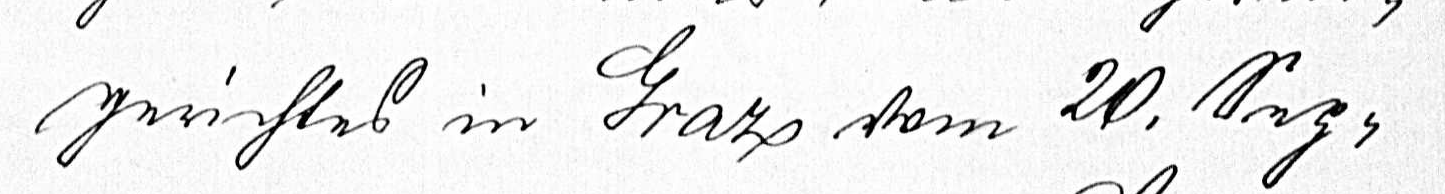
gerichtes in Graz vom 20. Sep¬
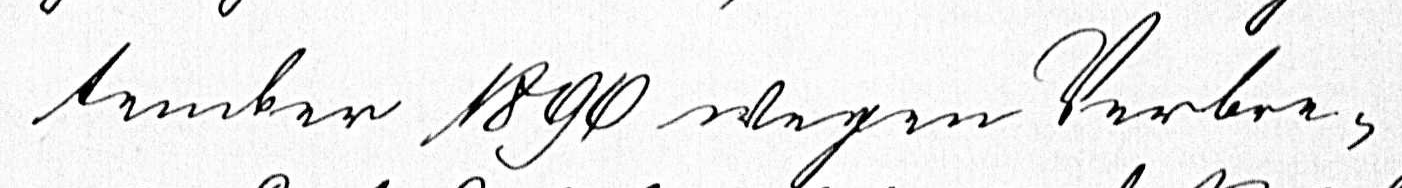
tember 1890 wegen Verbre¬
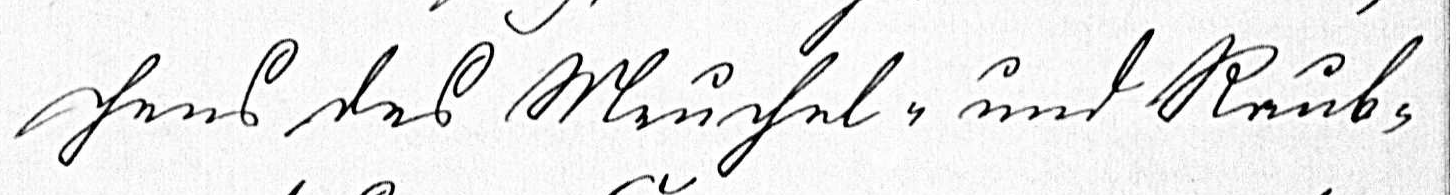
chens des Meuchel- und Raub¬
